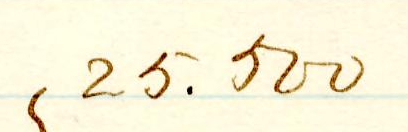25.000
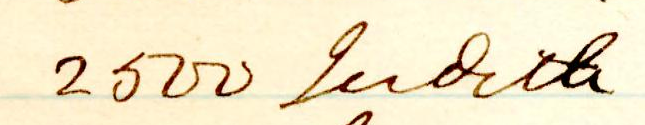2500 Judith
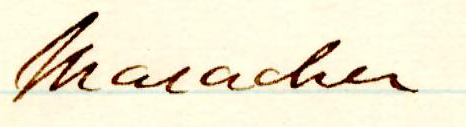Maracher
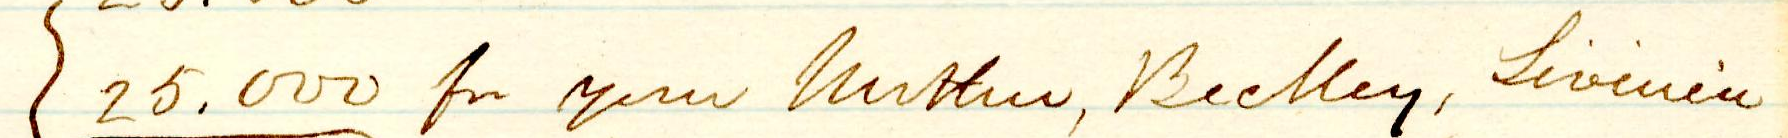25.000 for your brothers, Beckey, Liviuea
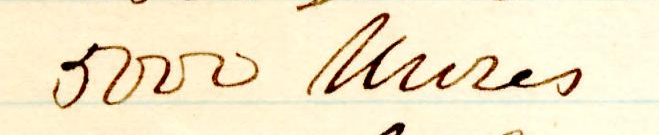5000 Moses
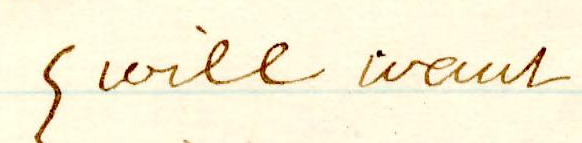will want
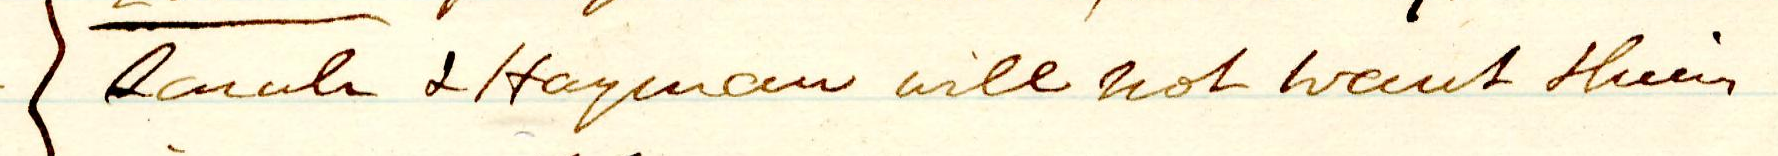Sarah & Hayman will not want theirs
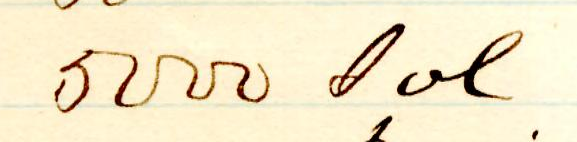5000 Sol
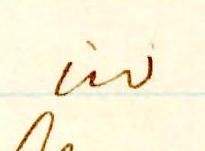in
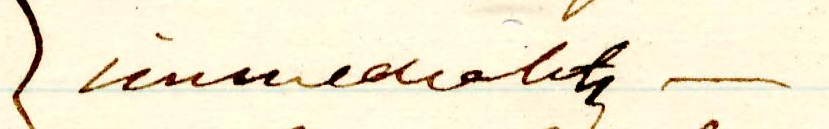immediately
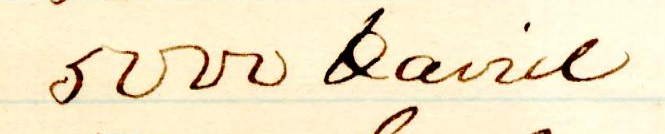5000 Daniel
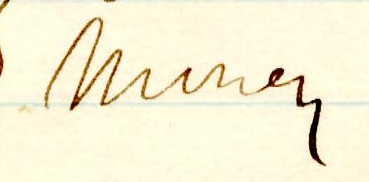money
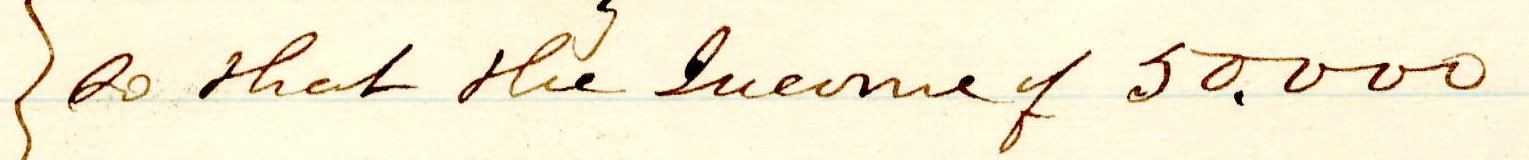So that the value of 50,000
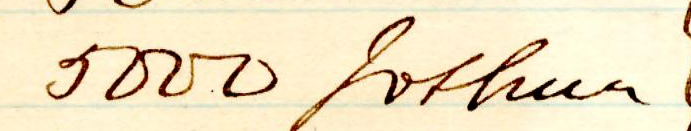5000 Joshua
